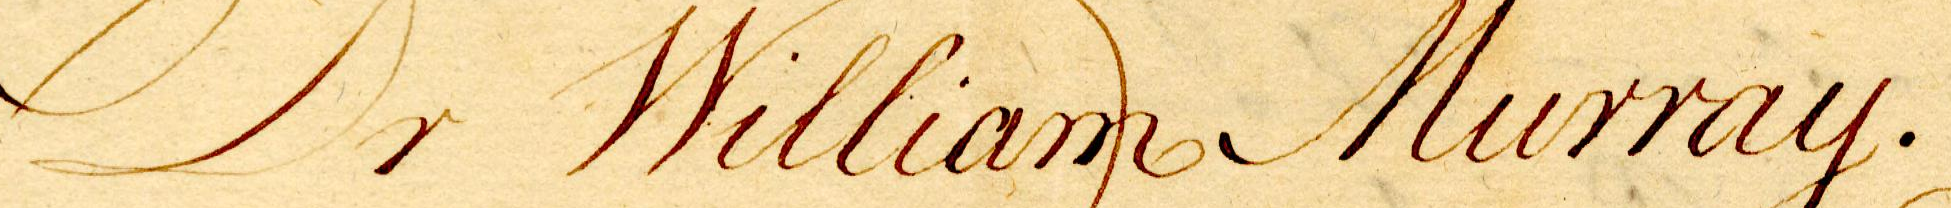Dr William Murray.
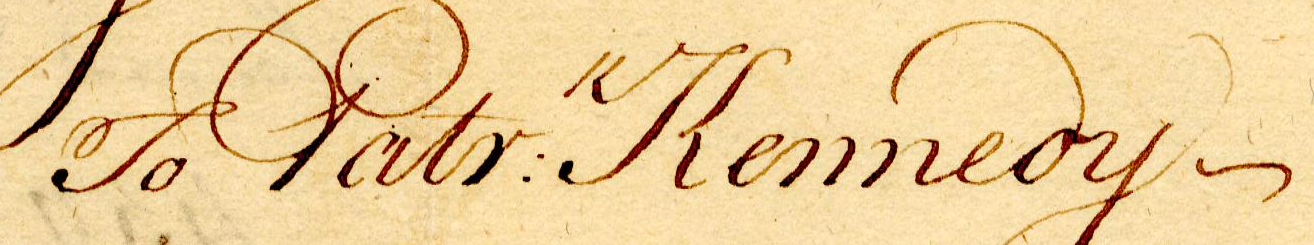To Patr^k: Kennedy-
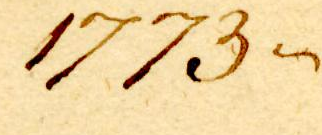1773-
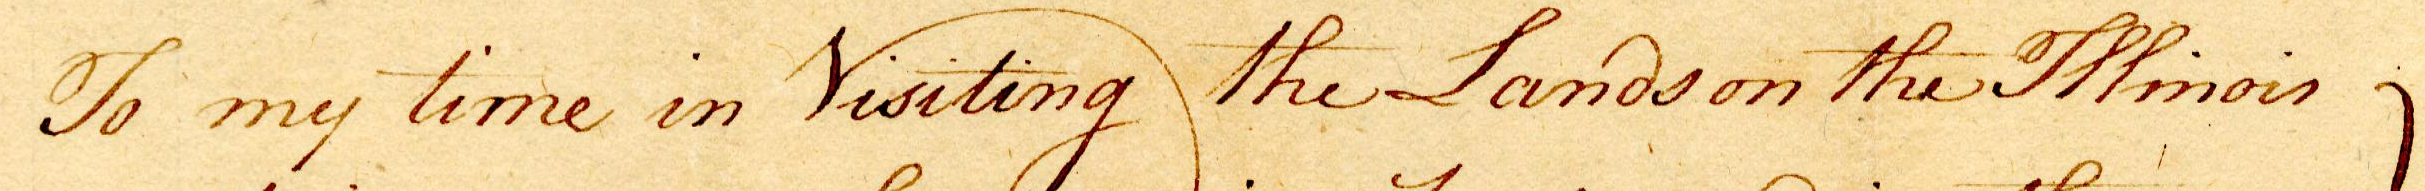To my time in Visiting the Lands on the Illinois
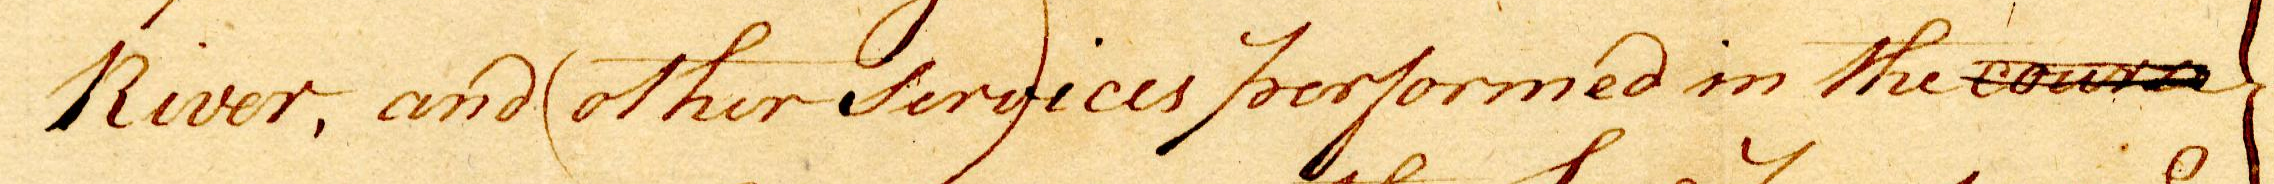River, and other services performed in the [course]
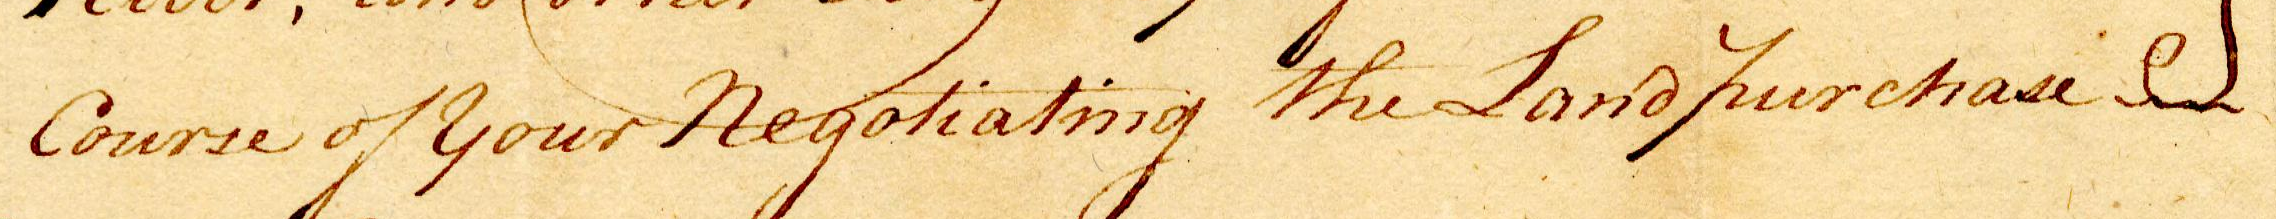Course of Your Negotiating the Land purchase-
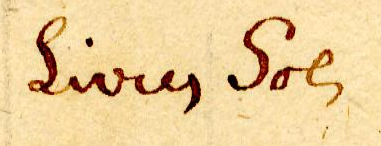Lives Sol
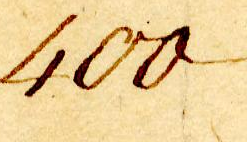400
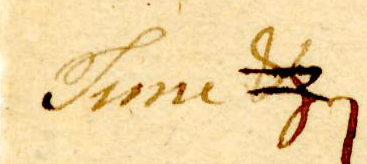Time [&]
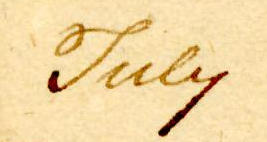July
